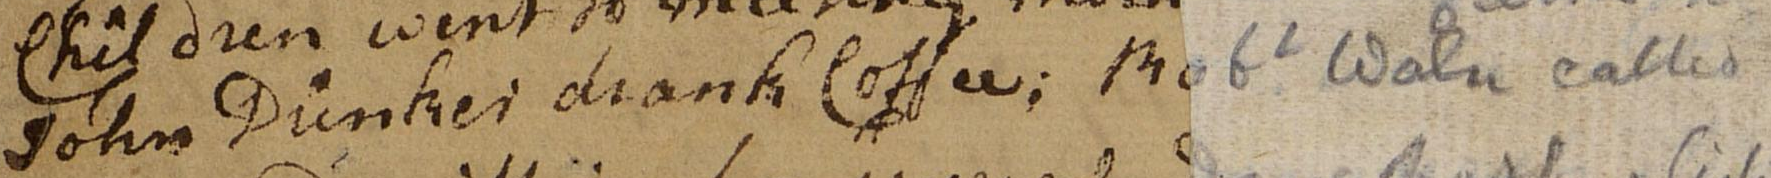John Drinker drank Coffee; Rob^t Waln called
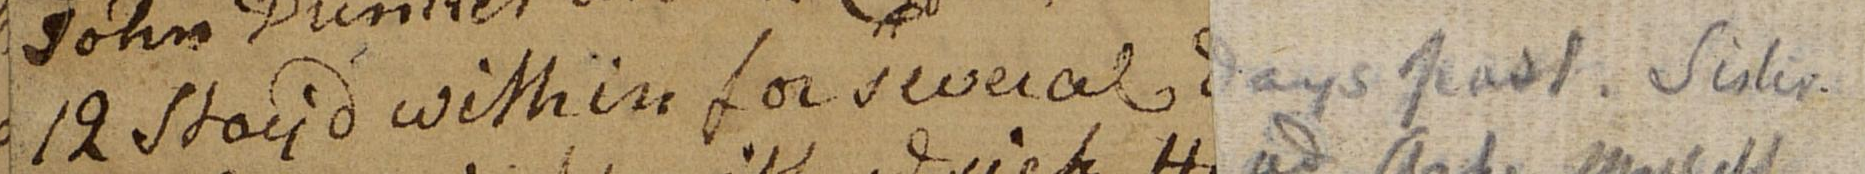12 Stay'd within for several days past. Sister
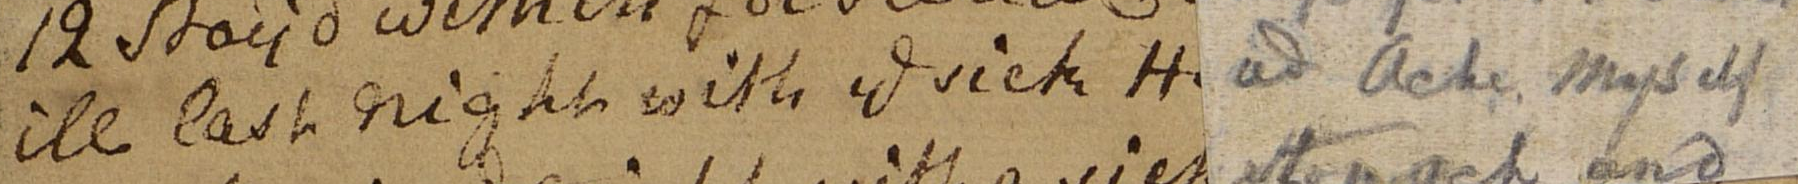ill last night with y^e sick Head Ache, myself
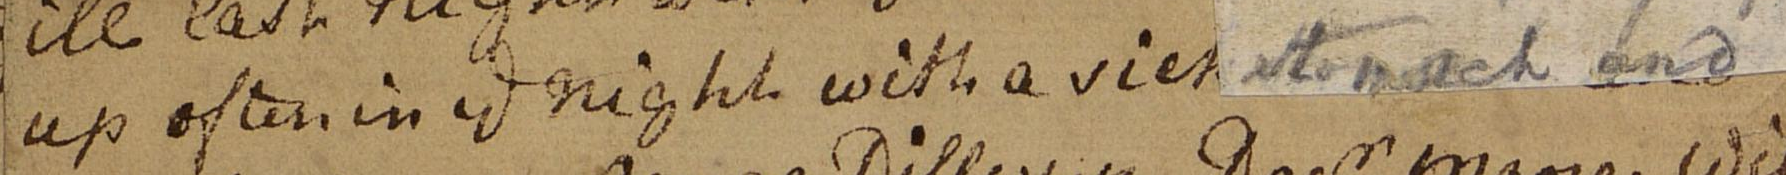up often in y^e night with a sick stomach and
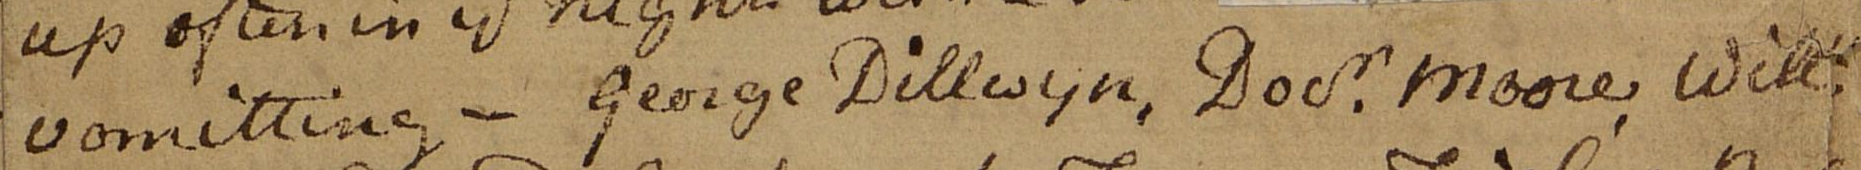vomitting- George Dillwyn, Doc^r. Moore Will[^m]
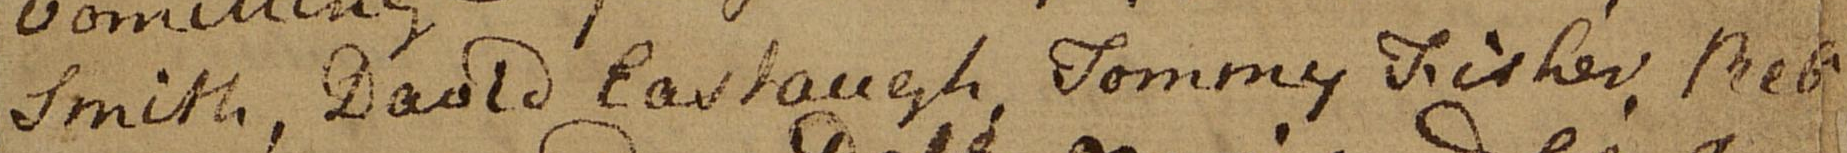Smith, David Eastaugh, Tommy Fisher, Reb[^a]
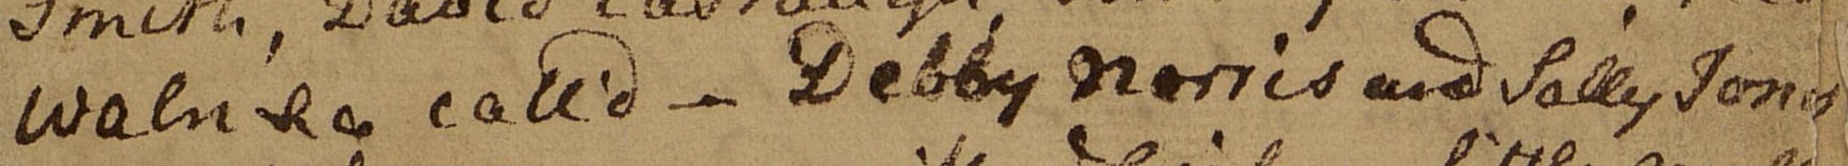Waln be call'd- Debby Norris and Sally Jones
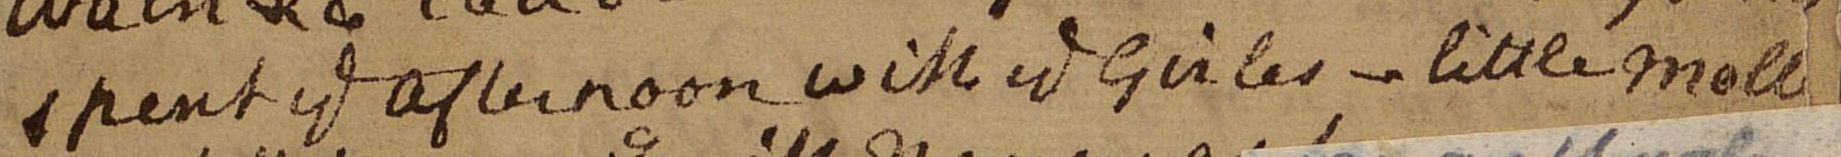spent y^e afternoon with y^e Girles- little Moll
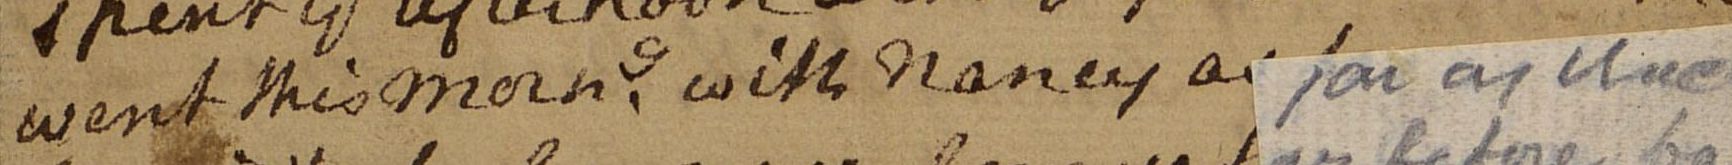went this Morn^g. with Nancy as far as Uncle
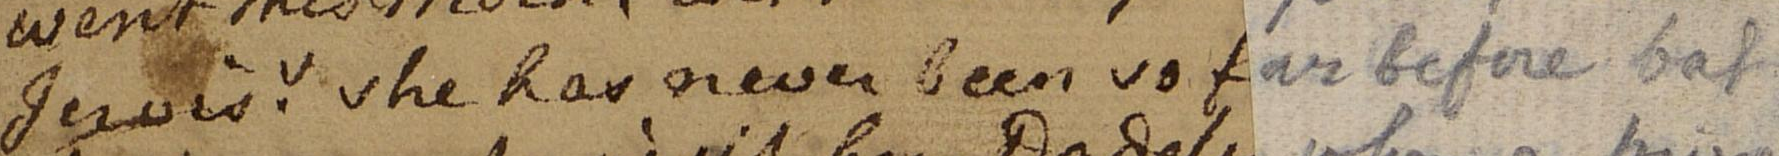Jervis^s. she has never been so far before bat
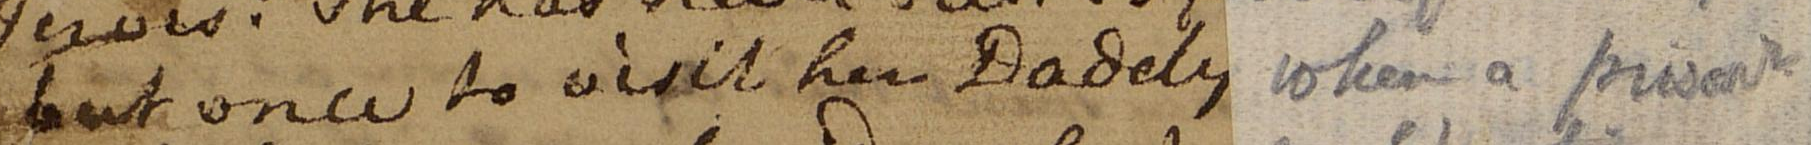but once to visit her Daddy when a [prison^r]
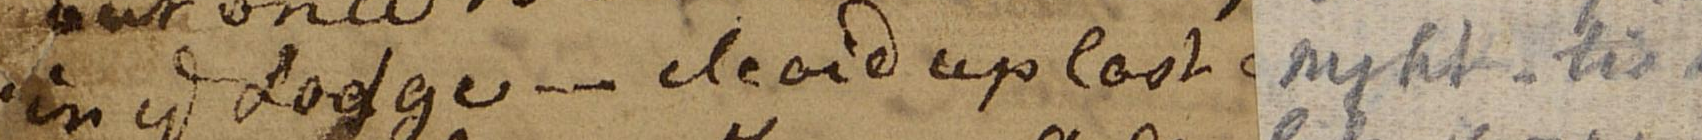in y^e Lodge-- clear'd up last night tis
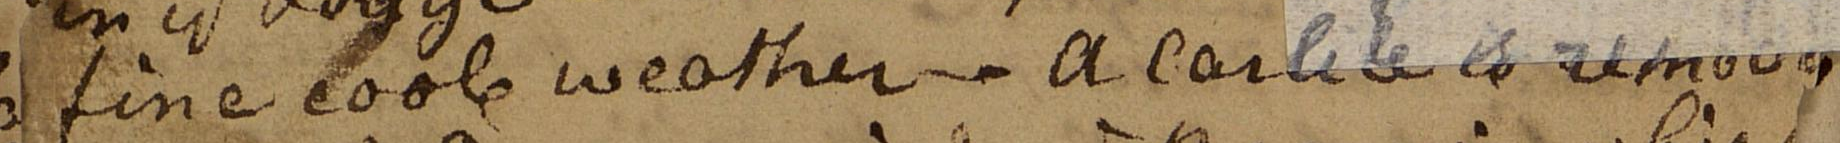fine cool weather- A Carlile is remove
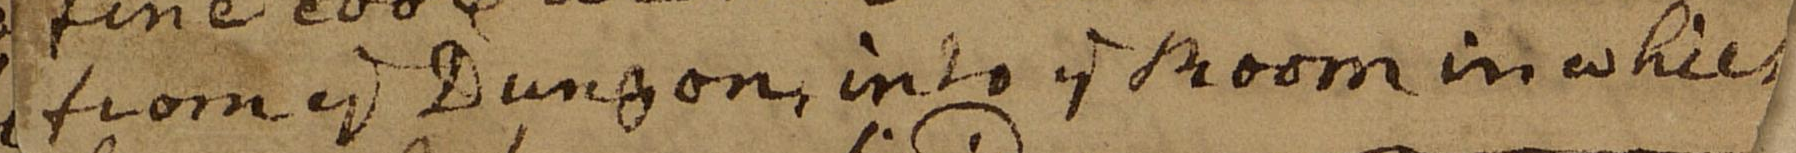from y^e Dungon, into y^e Room in which
